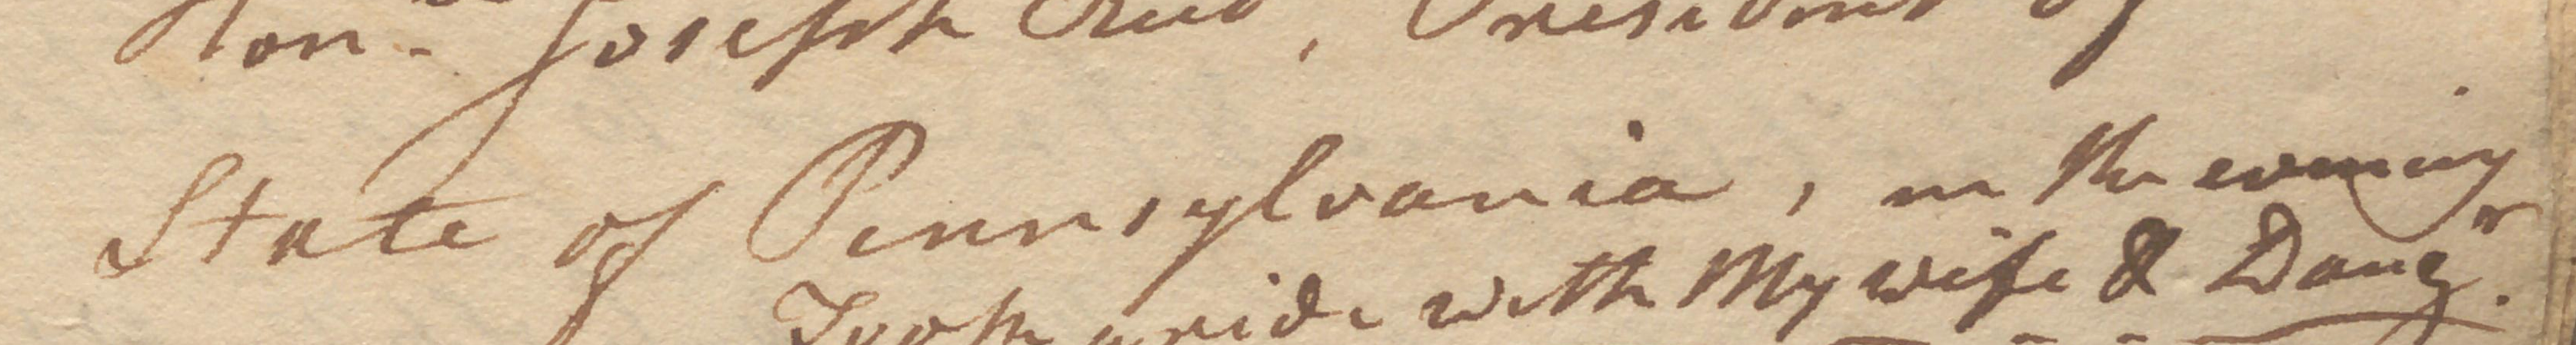State of Pennsylvania, in the evening
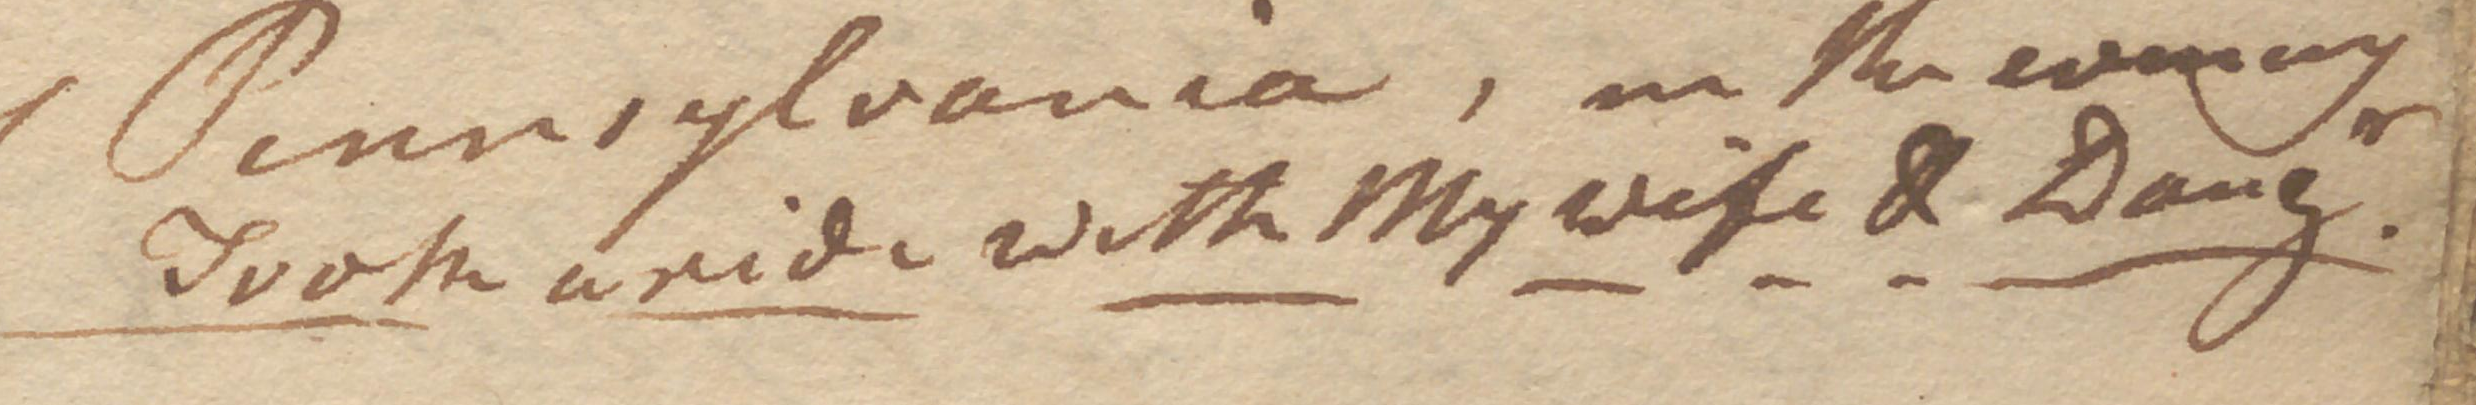Took a ride with My wife & Daug^r.
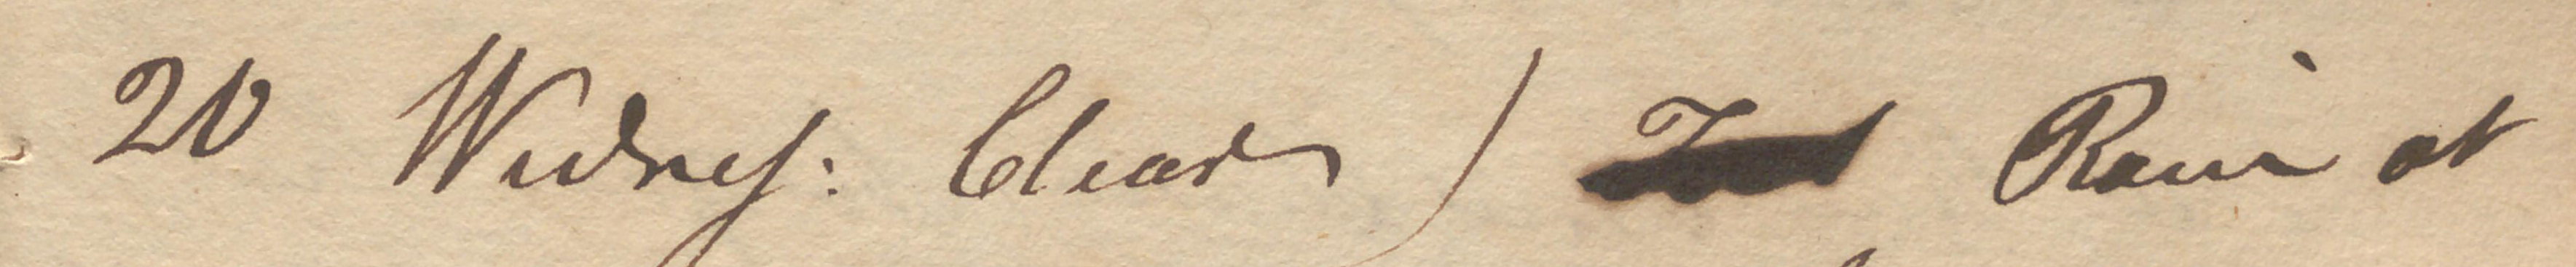20 Wednes. Clear / [___] Rain at
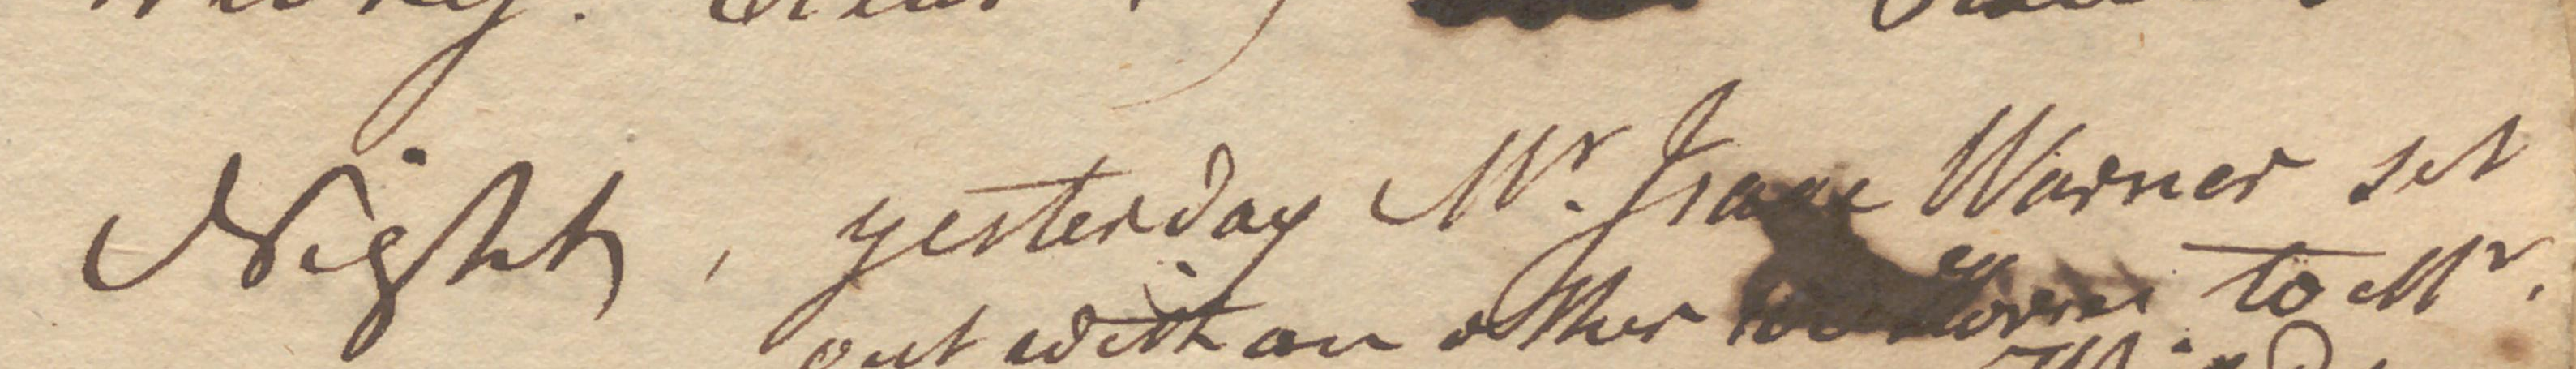Night, yesterday M^r. Isaac Warner set
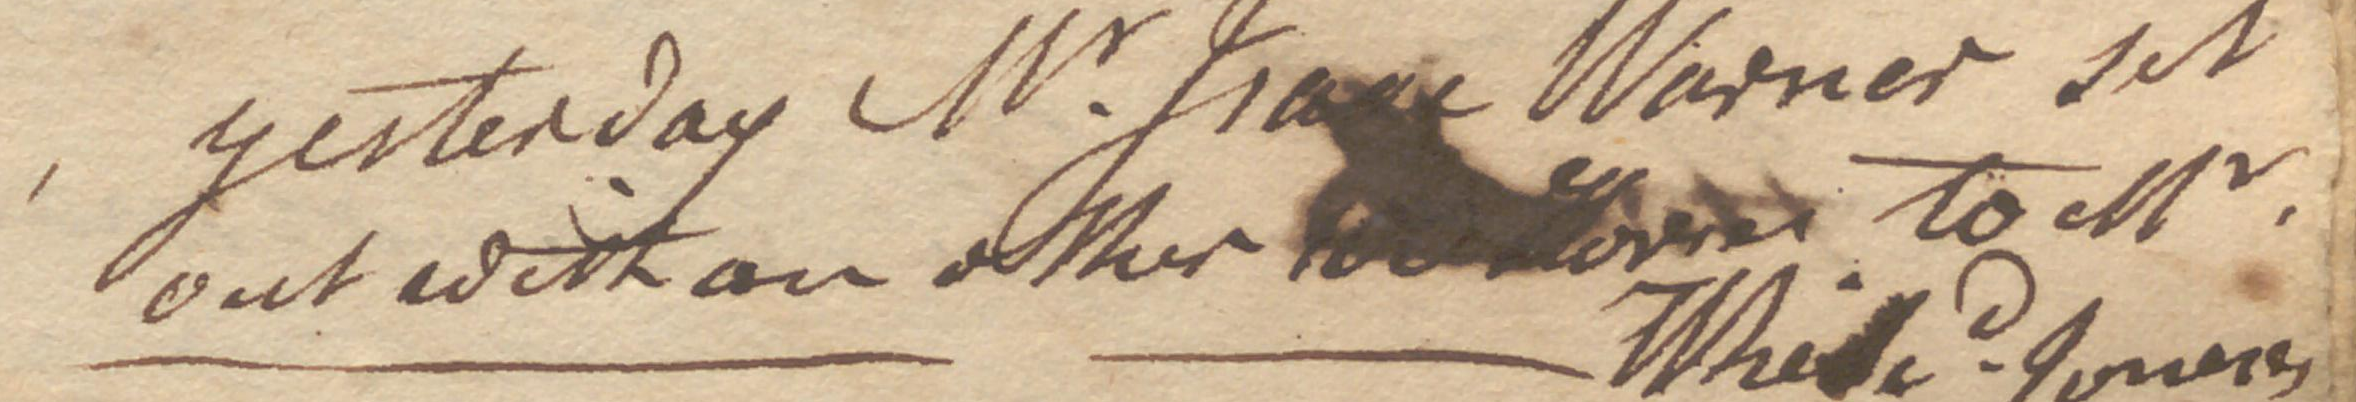out with an other 100 Horses to M^r
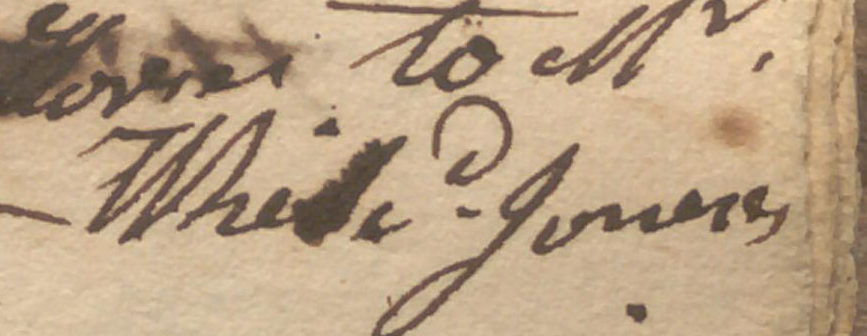White^d. Joneres
